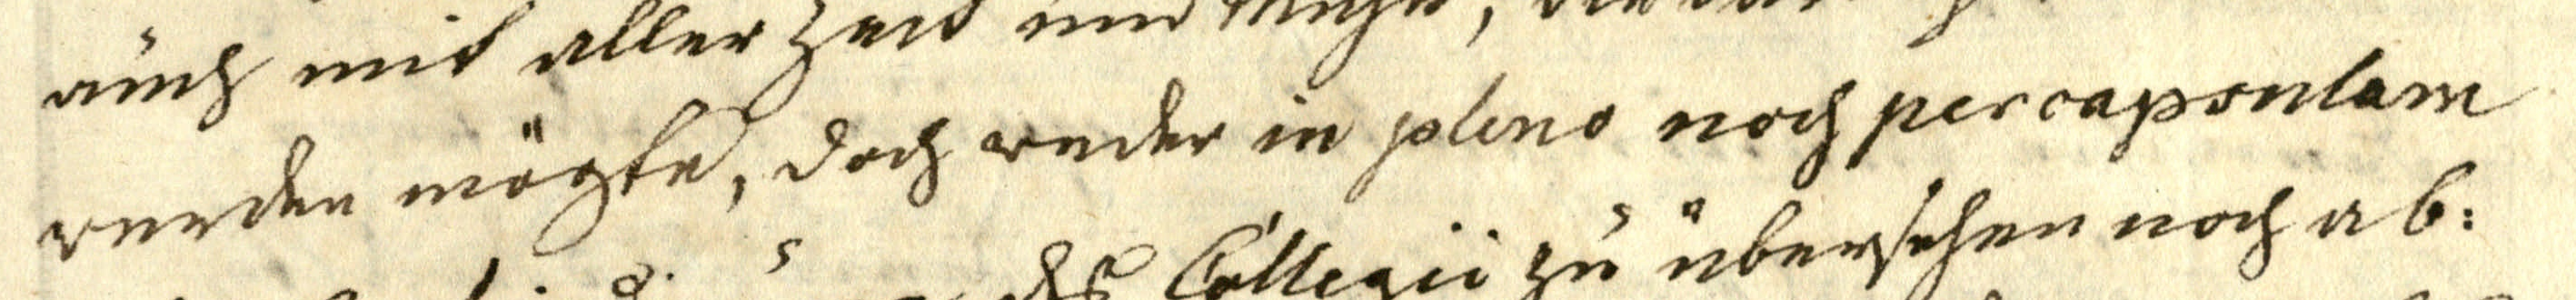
werden mögte, doch weder in pleno noch per capsulam
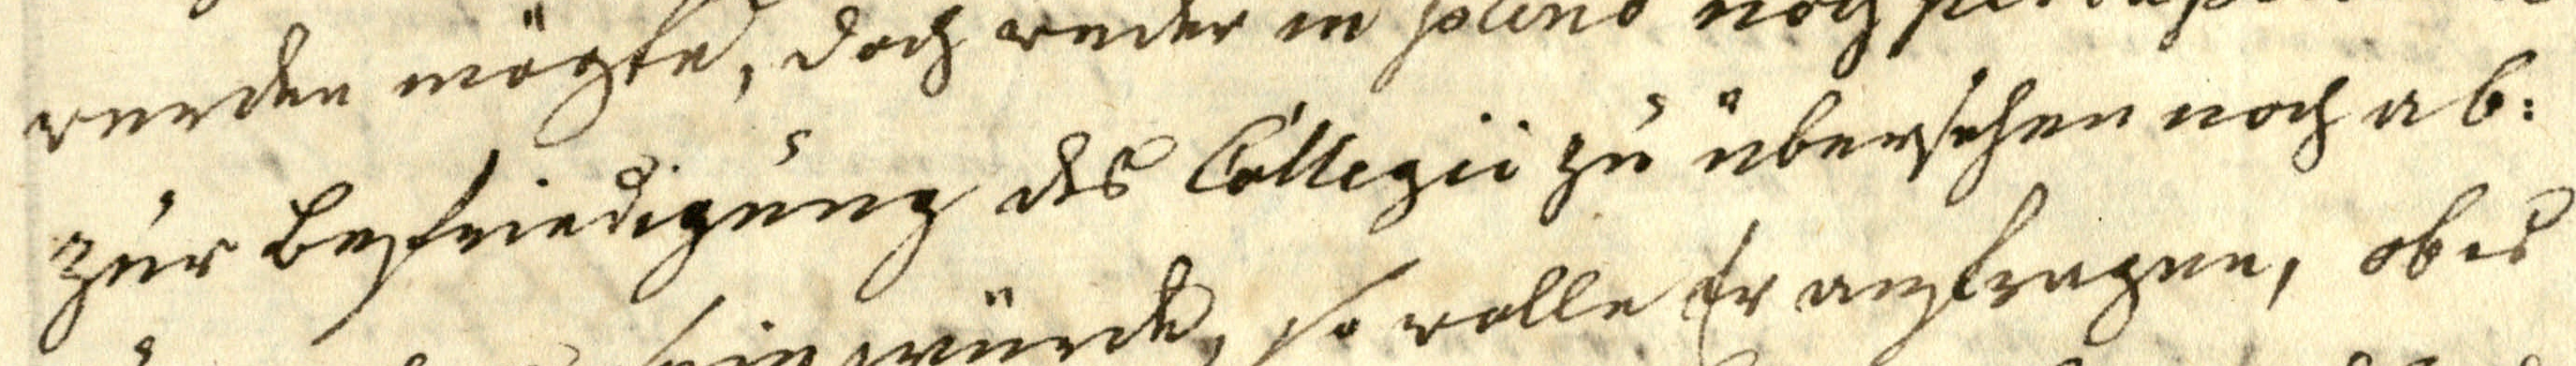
zur Befriedigung des Collegii zu übersehen noch ab¬
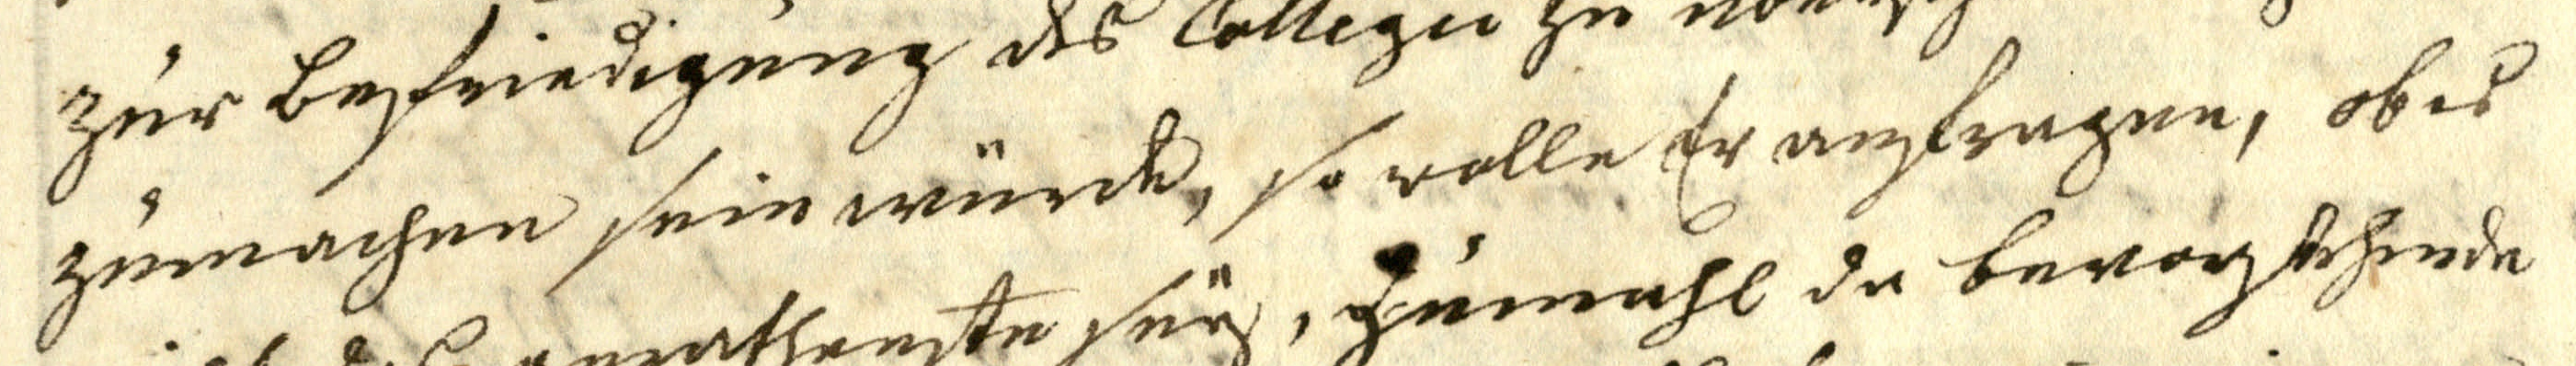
zumachen sein würde, so wolle Er anfragen, ob es
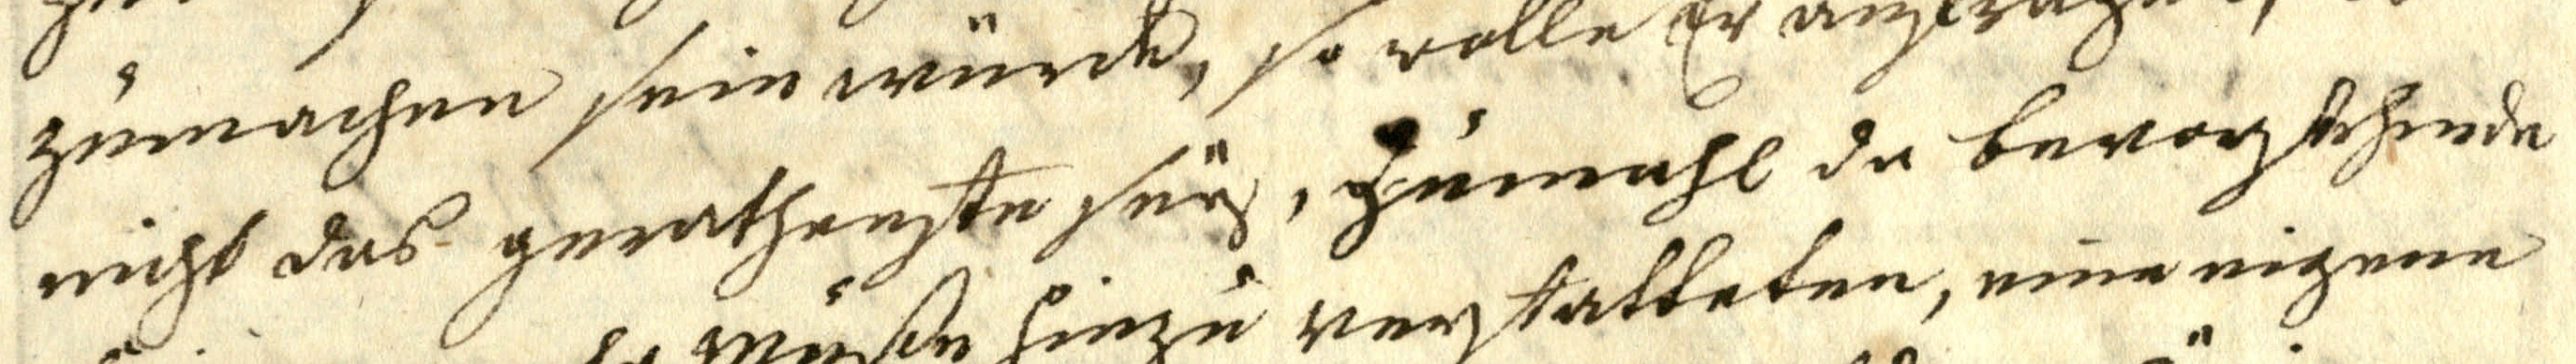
nicht das gerathenste seÿ, zumahl da bevorstehende
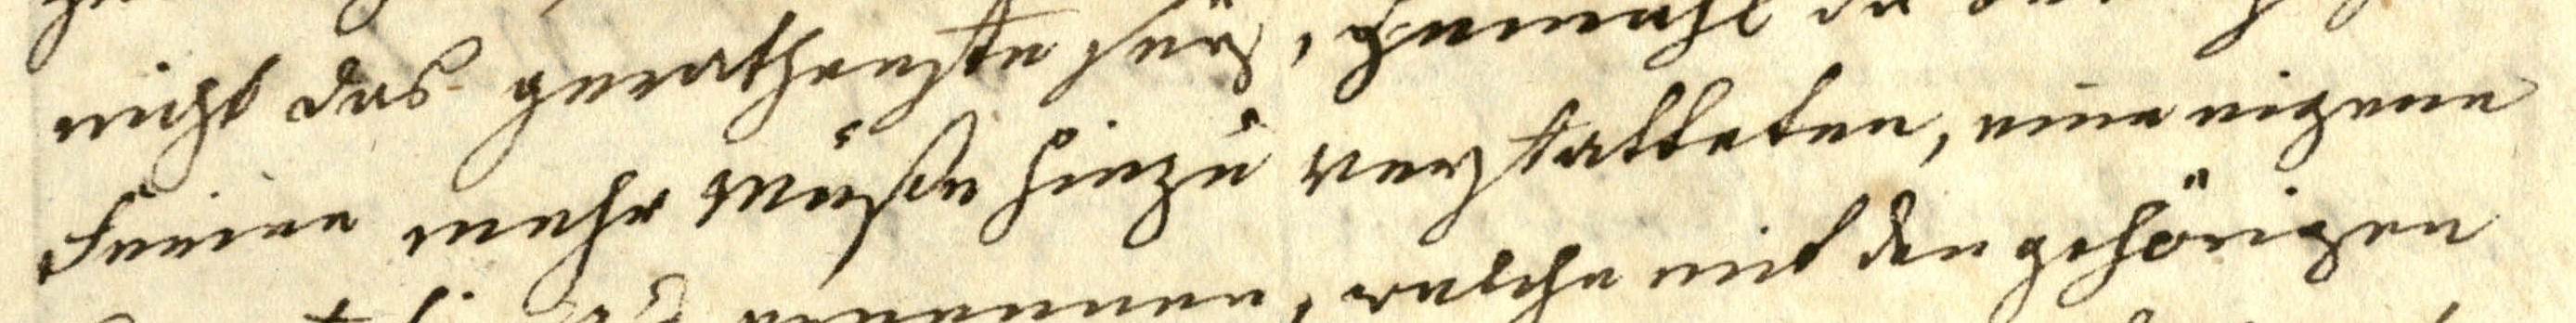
Ferien mehr Muße hiezu verstatteten, eine eigene
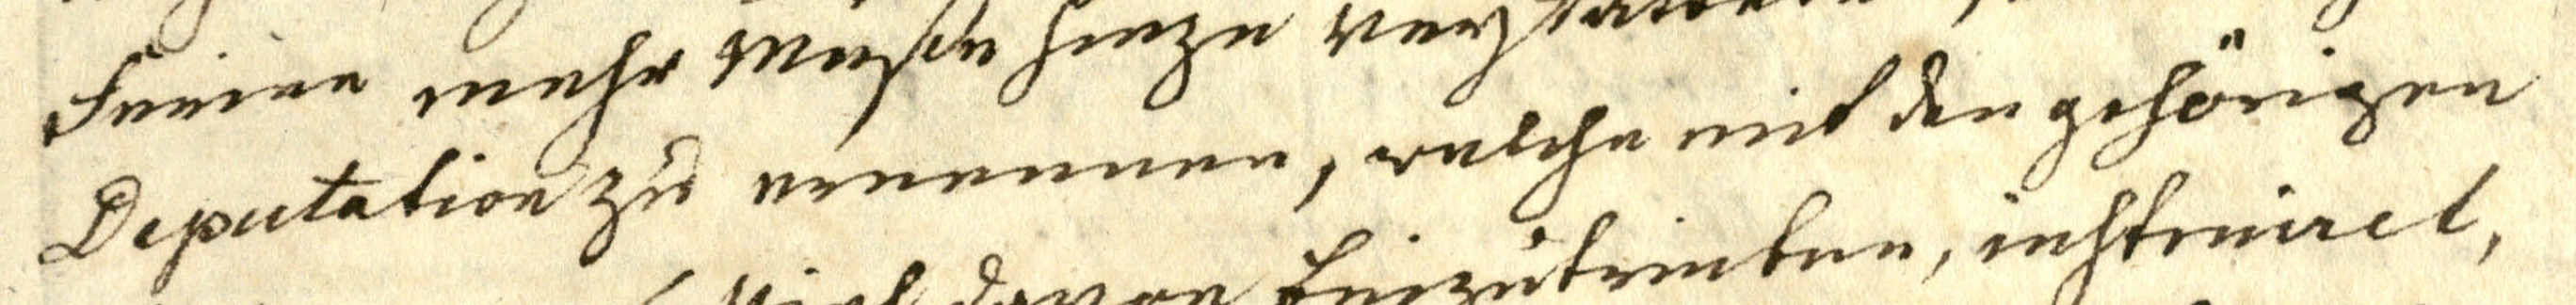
Deputation zu ernennen, welche mit den gehörigen
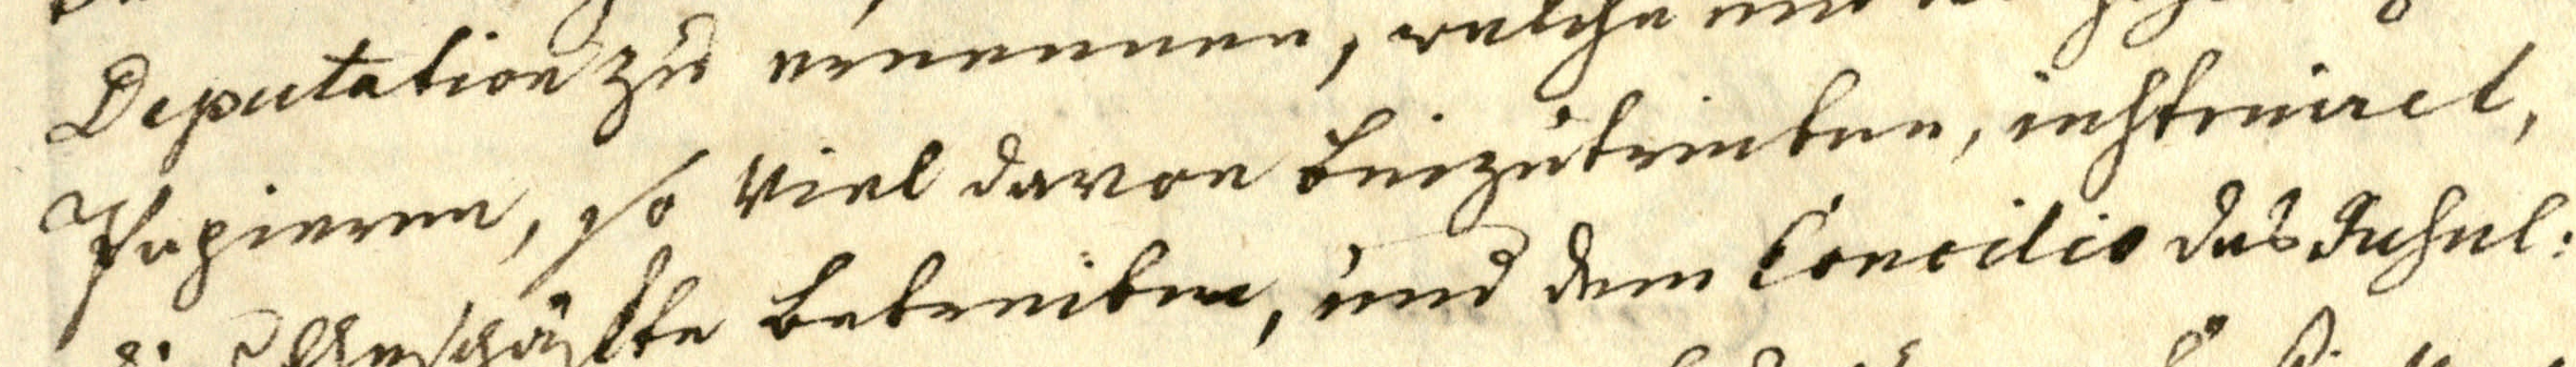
Papieren, so viel davon beizutreiben, instruiret,
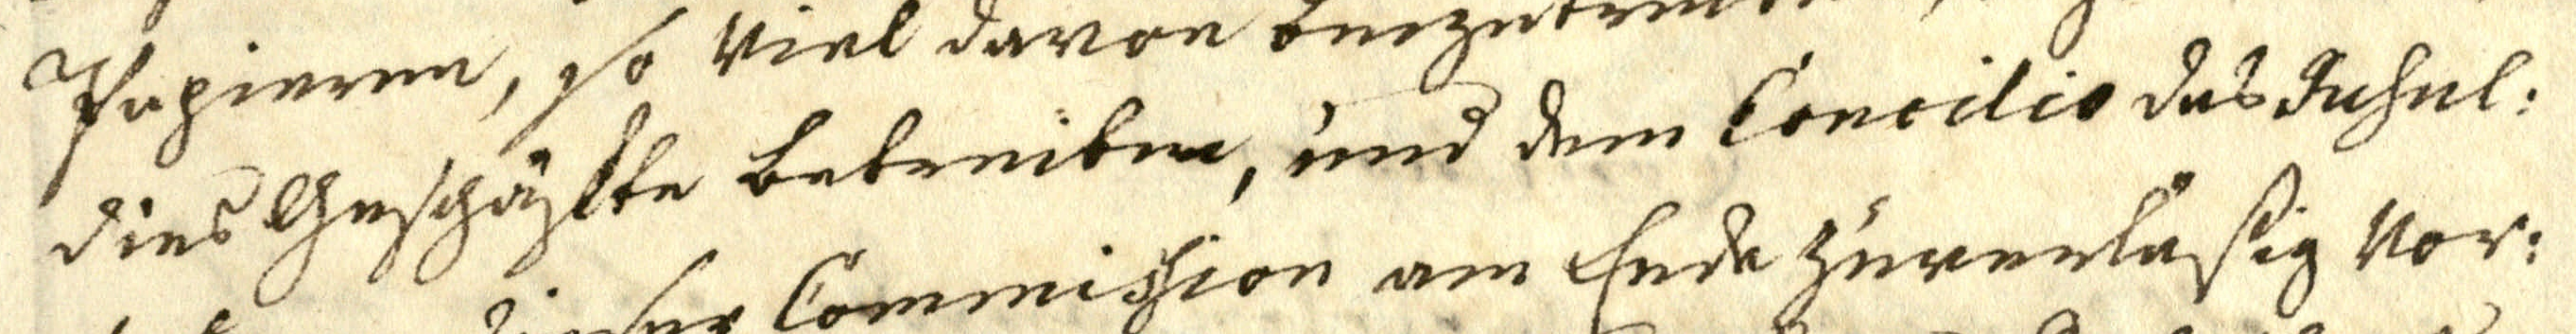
dies Geschäfte betreiben, und dem Concilio das Resul¬
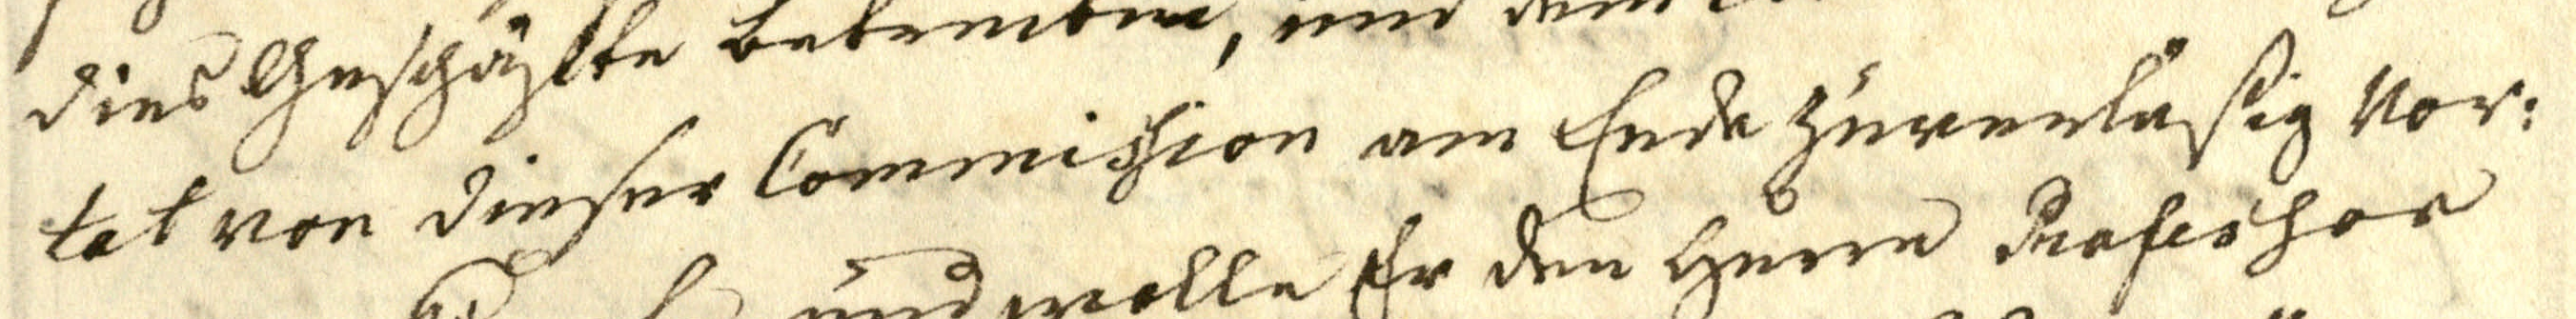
tat von dieser Commission an Ende zuverläßig vor¬
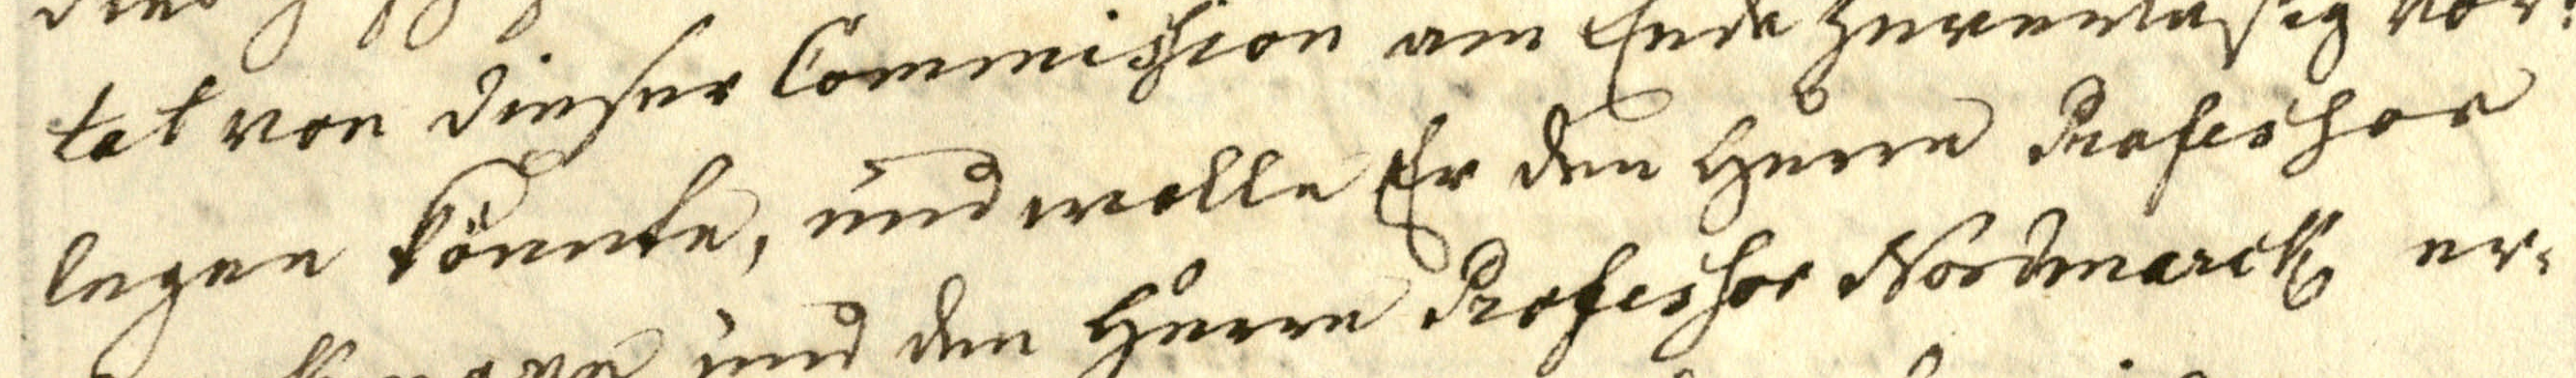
legen könnte, und wolle Er den Herrn Professor
